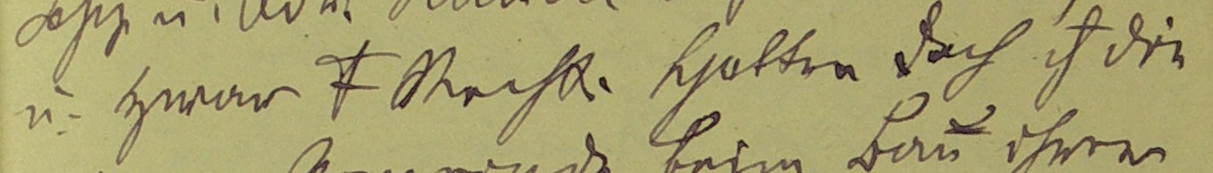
und zwar mit Recht. Hatten doch auch die
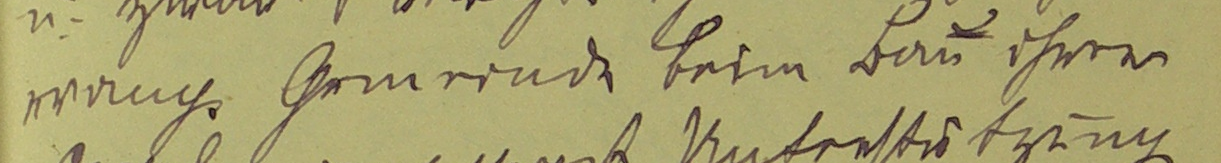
evang. Gemeinde beim Bau ihrer
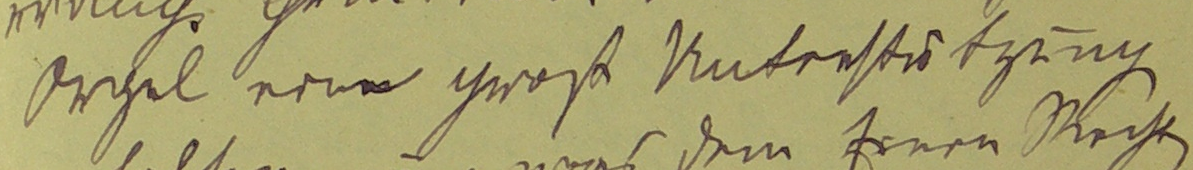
Orgel eine große Unterstützung
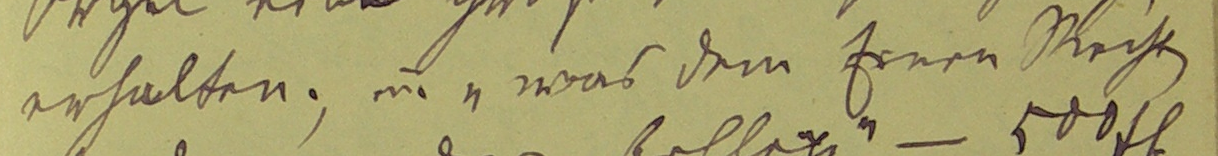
erhalten, und was dem dem Einen Recht ,
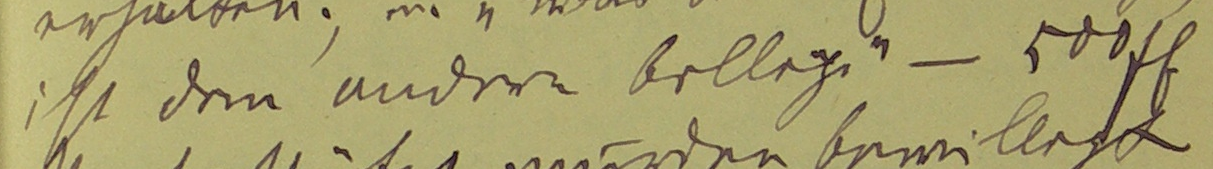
ist dem anderen billig.- 500 Fl.
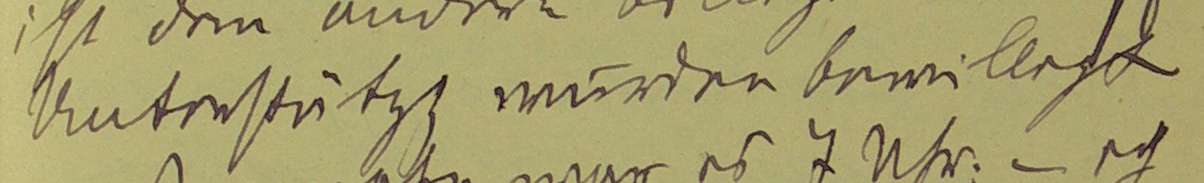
Unterstützung wurden
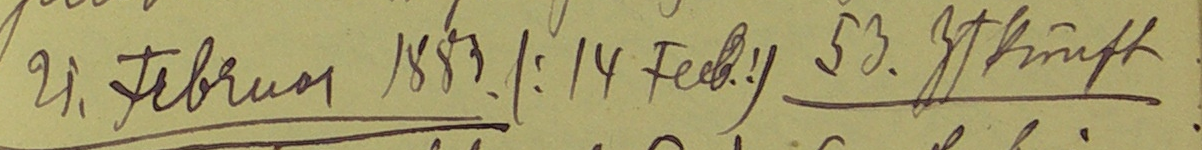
21. Februar 1883. ( : 14 Febr. : ) 53. Zusammenkunft
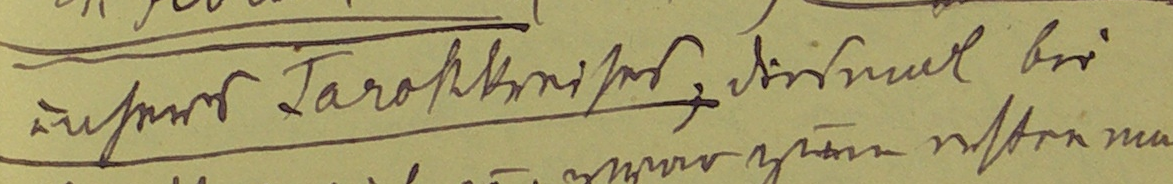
unseres Tarokkreises , diesmal
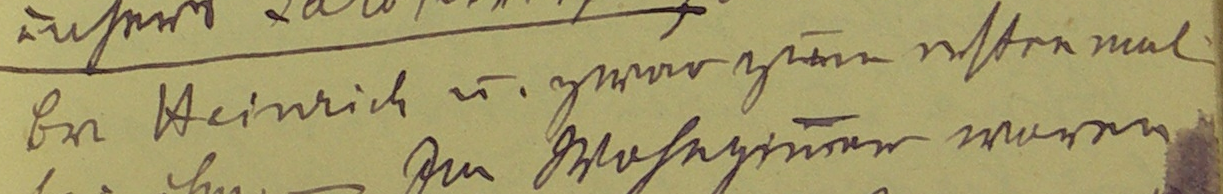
bei Heinrich und zwar zum ersten mal
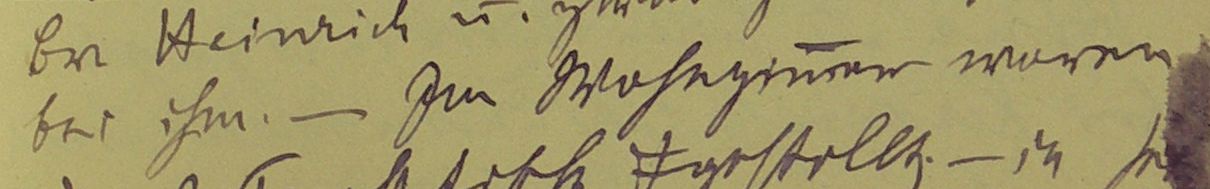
bei ihm.-Im Wohnzimmer waren
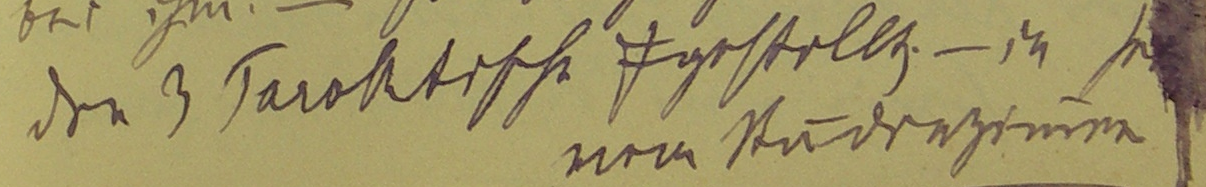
die 3 Taroktische aufgestellt.- in sei¬
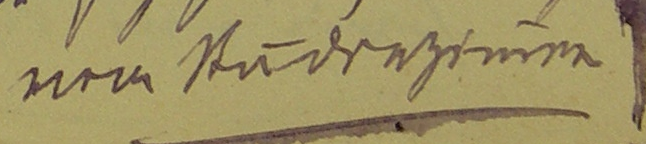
nem Studierzimmer
